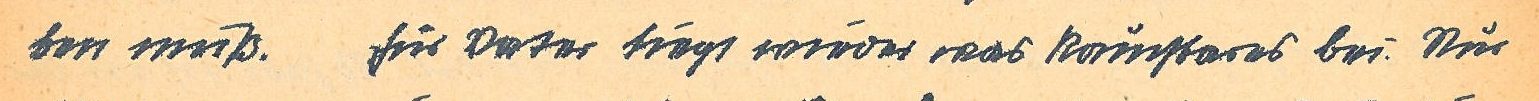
ben muß. Für Vater liegt wieder was Rauchbares bei. Nur
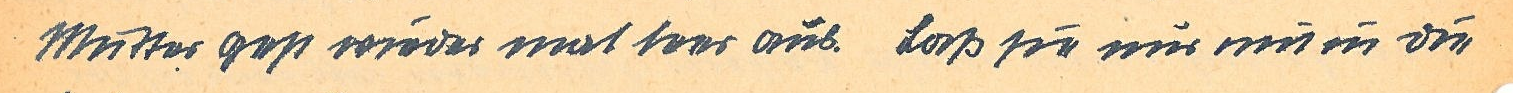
Mutter geht wieder mal leer aus. Laß sie nur mit in die
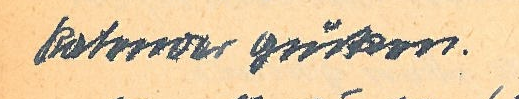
Kalender gucken.
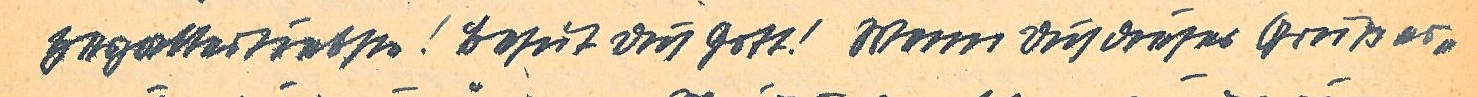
Herzallerliebste! Behüt Dich Gott! Wenn Dich dieser Gruß er¬
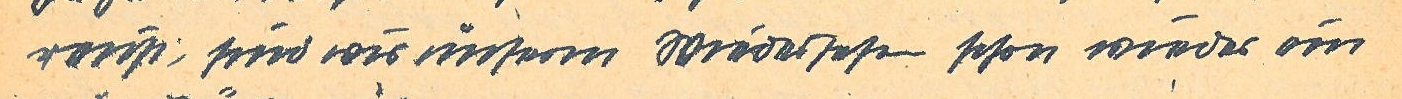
reicht, sind wir unserm Wiedersehen schon wieder ein
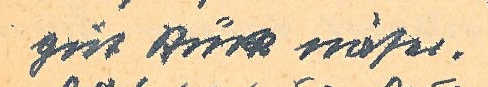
gut Stück näher.
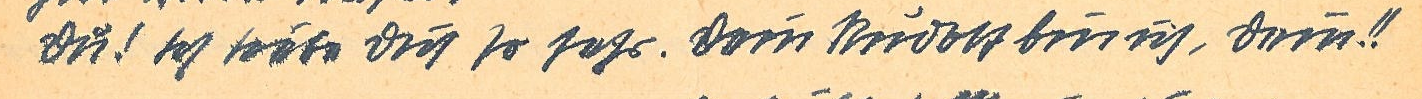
Du! Ich liebe Dich so sehr. Dein bin ich, Dein!!
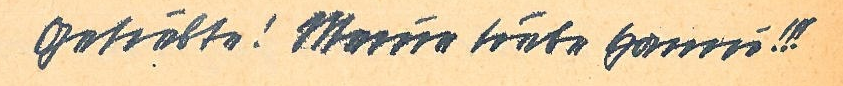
Geliebte! Meine liebe !!!
